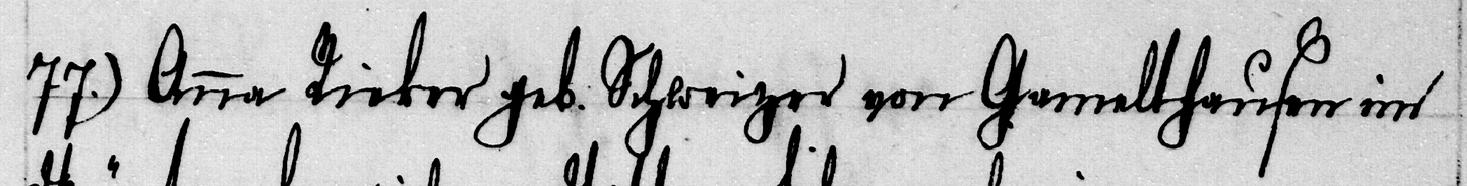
77.) Anna Rieker geb. Schweizer von Gamelthausen im
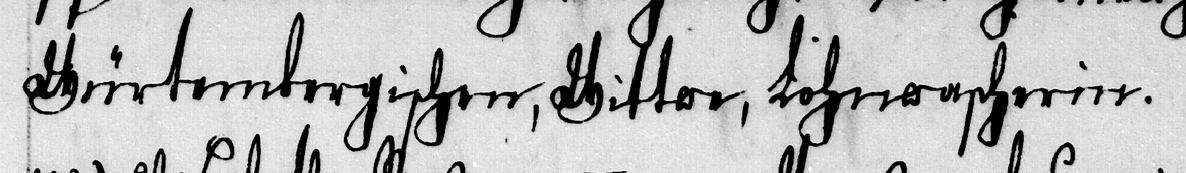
Würtembergischen, Wittwe, Lohnwascherin.
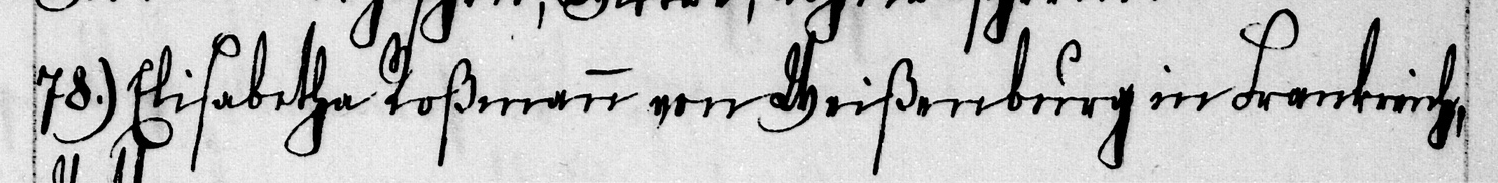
78.) Elisabetha Rossmann von Weißenburg in Frankreich,
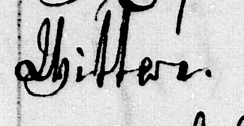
Wittwe.
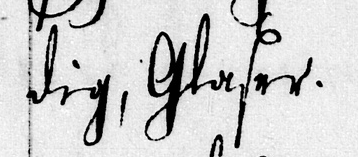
dig, Glaser.
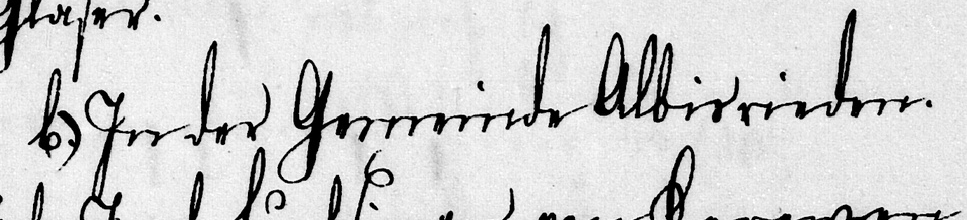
b.) In der Gemeinde Albisrieden.
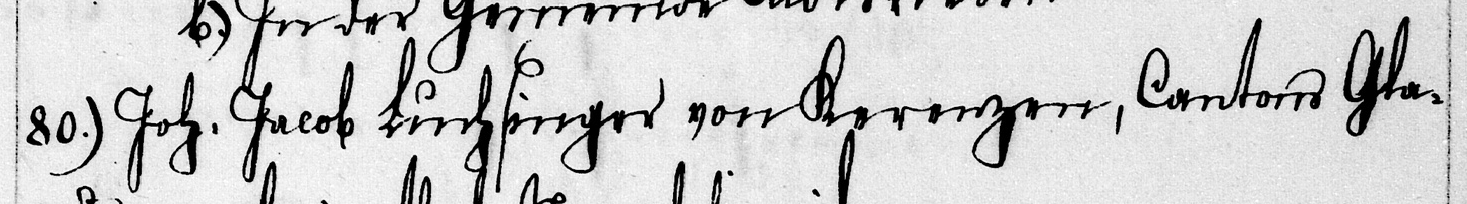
80.) Joh. Jacob Luchsinger von Kerenzen, Cantons Gla¬
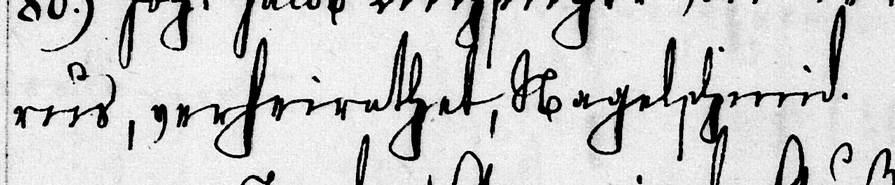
rus, verheirathet, Nagelschmid.
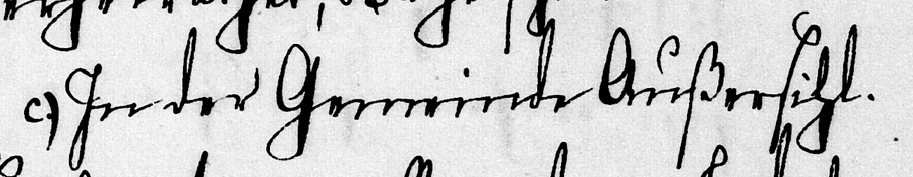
In der Gemeinde Außersihl.
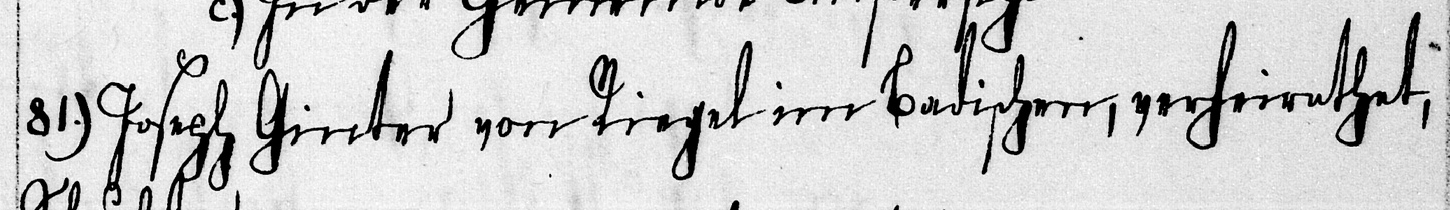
81.) Joseph Ginter von Riegel im Badischen, verheirathet,
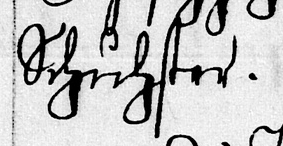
Schuhster.
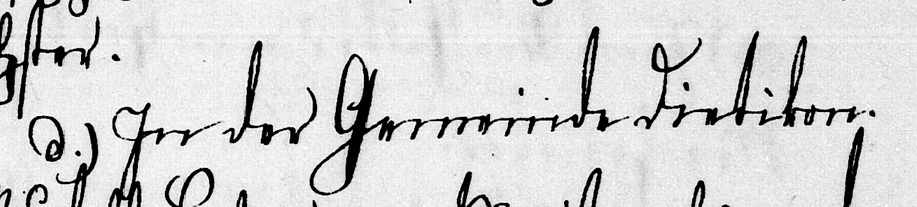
d.) In der Gemeinde Dietikon.
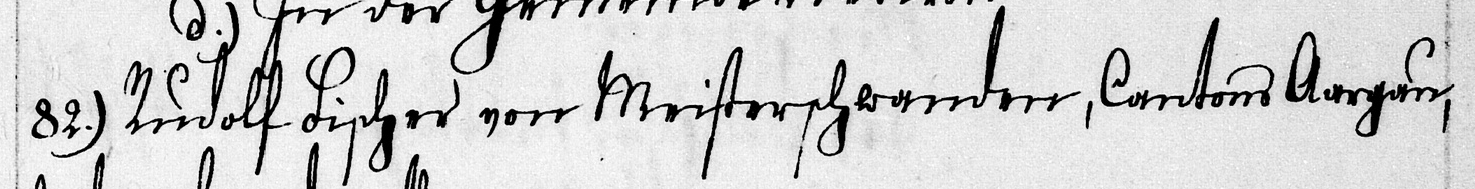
82.) Rudolf Fischer von Meisterschwanden, Cantons Aargau,
